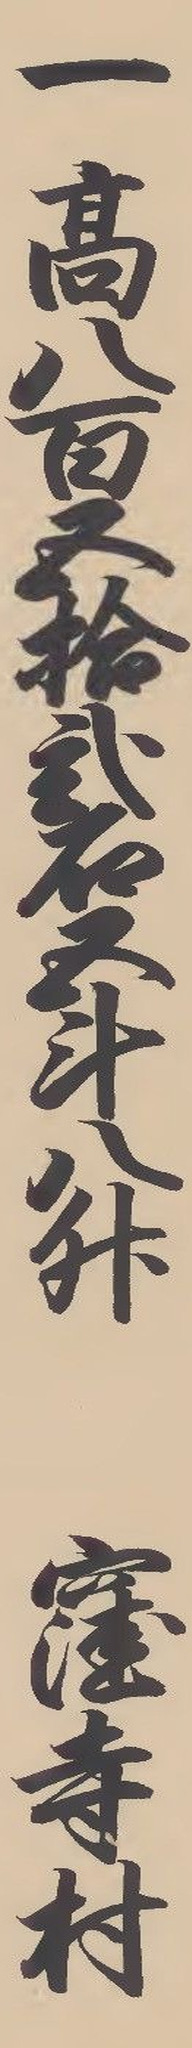一高八百五拾弐石五斗八升窪寺村
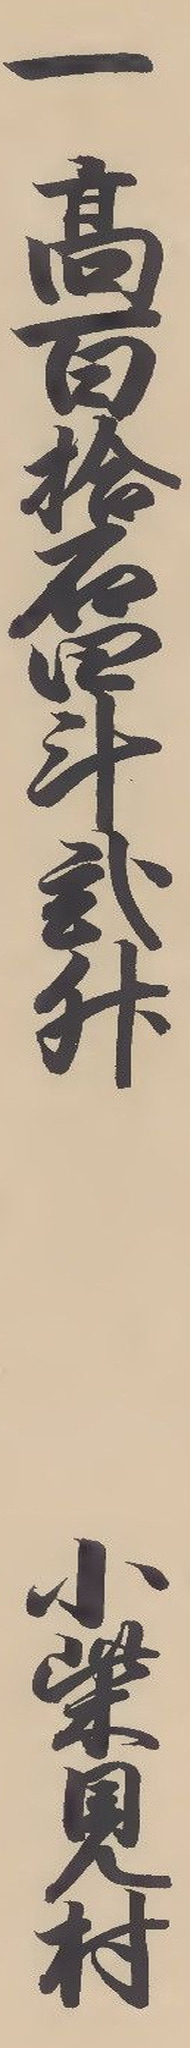一高百拾石四斗弐升小柴見村
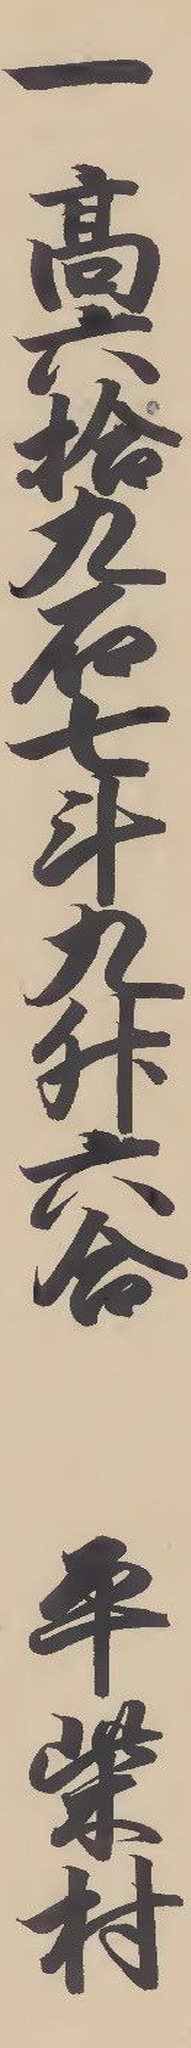一高六拾九石七斗九升六合平柴村
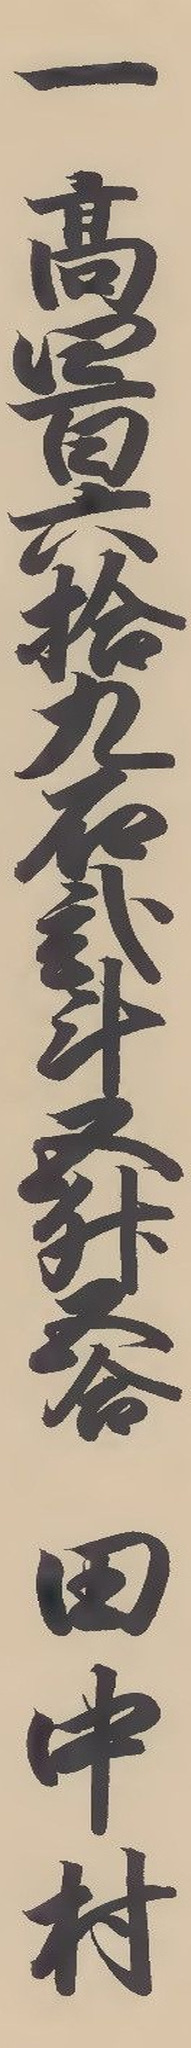一高四百六拾九石弐斗五升五合田中村
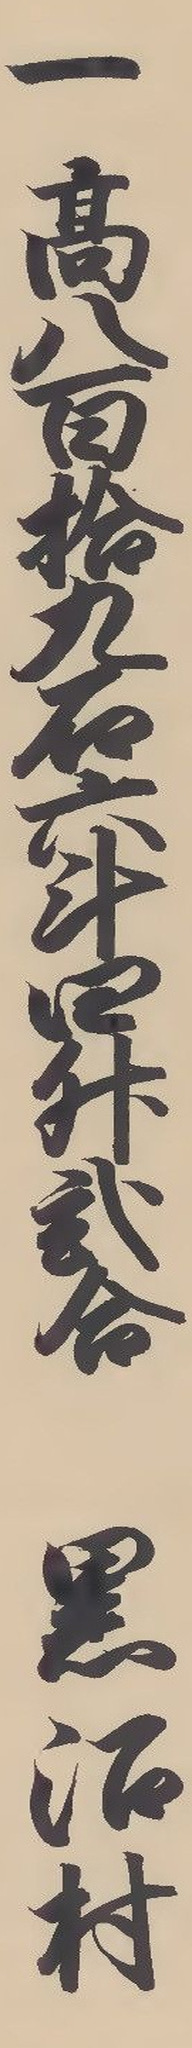一高八百拾九石六斗四升弐合黒沼村

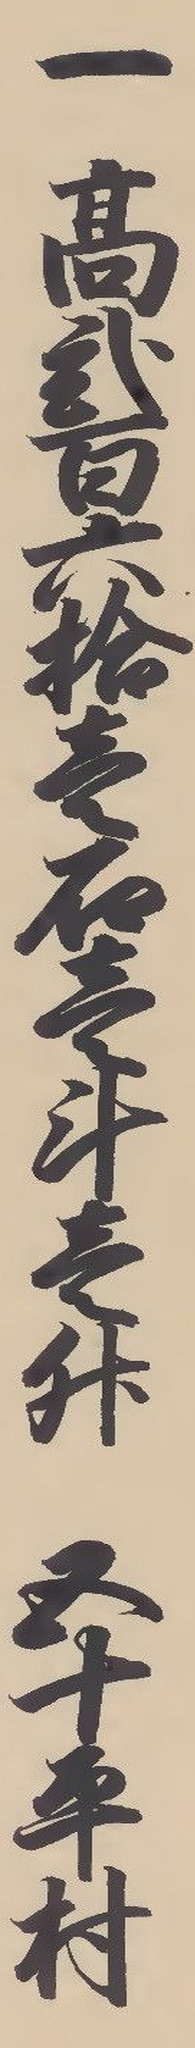一高弐百六拾壱石壱斗壱升五十平村
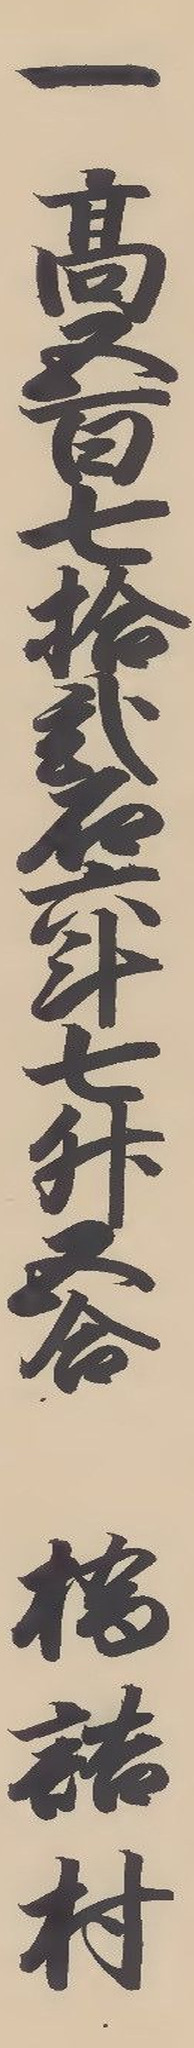一高五百七拾弐石六斗七升五合橋詰村
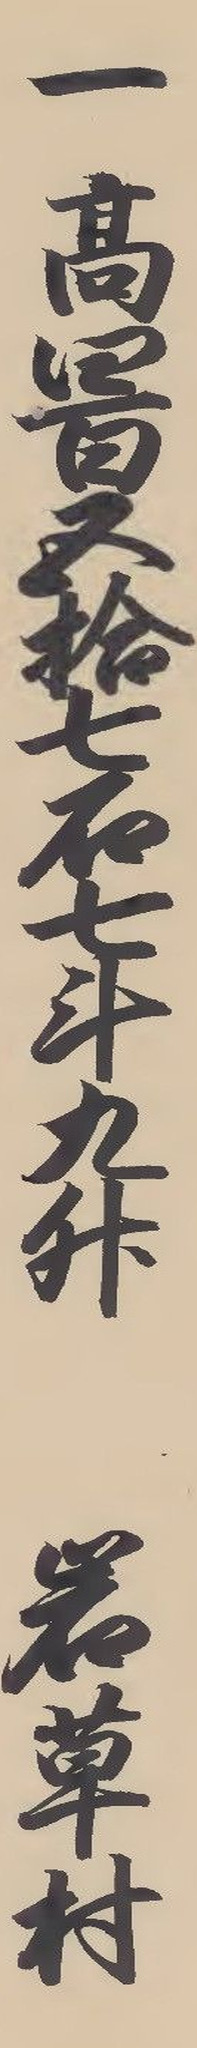一高四百五拾七石七斗九升岩草村
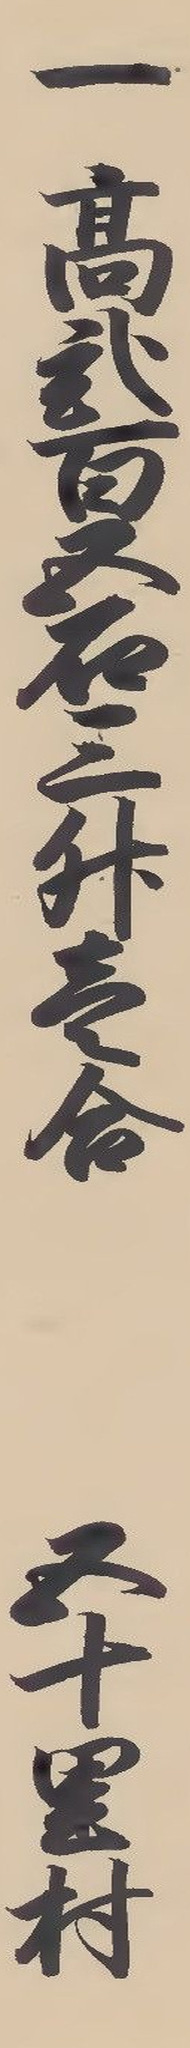一高弐百五石三升壱合五十里村
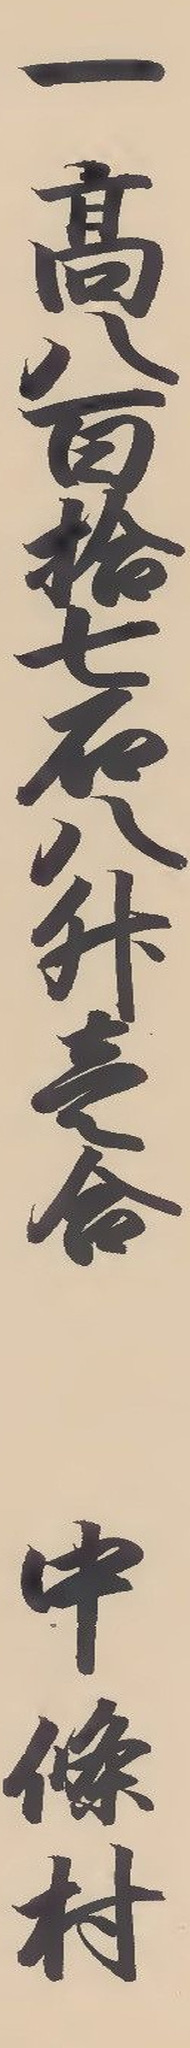一高八百拾七石八升壱合中条村
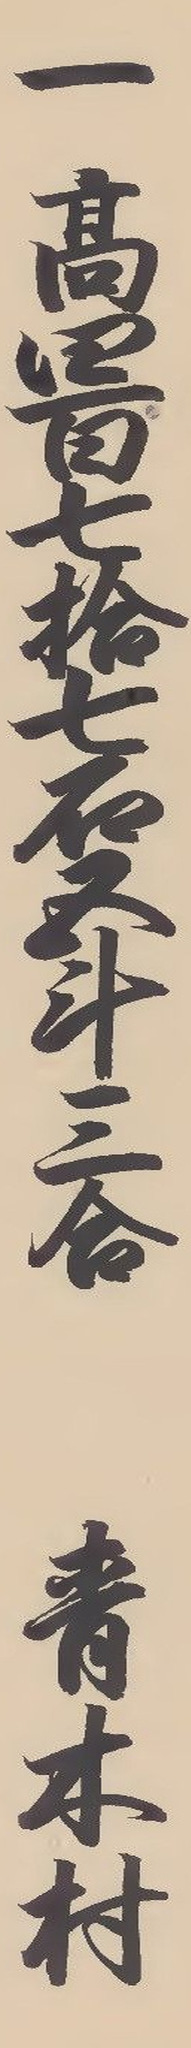一高四百七拾七石五斗三合青木村
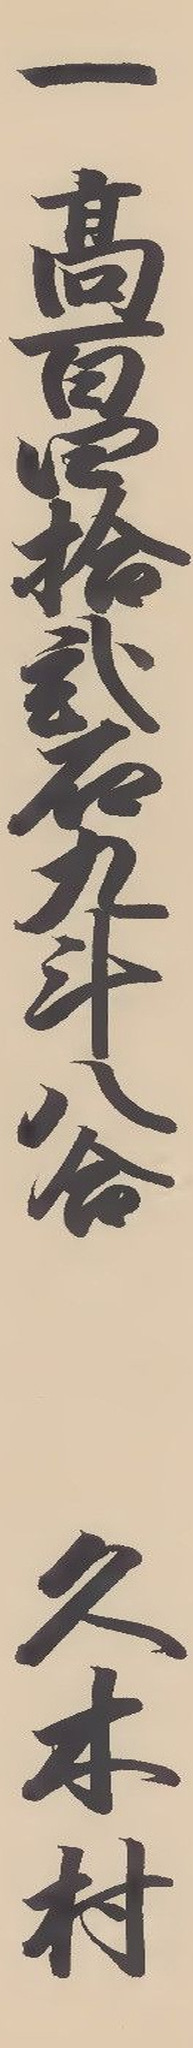一高百四拾弐石九斗八合久木村
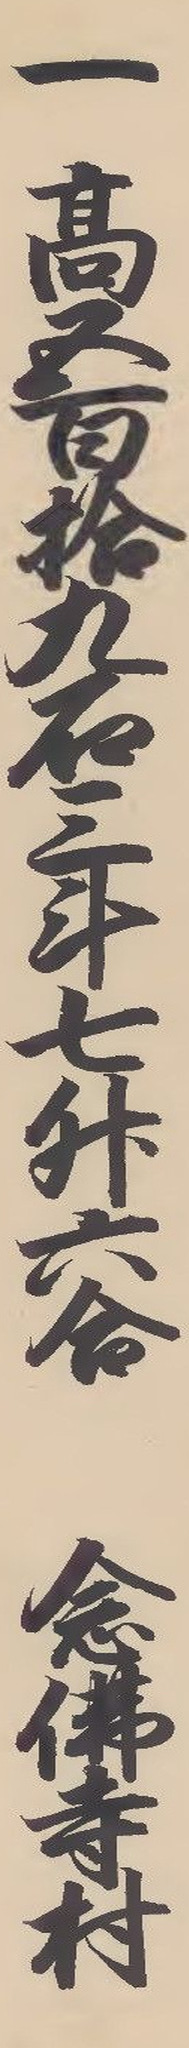一高五百拾九石三斗七升六合念仏寺村

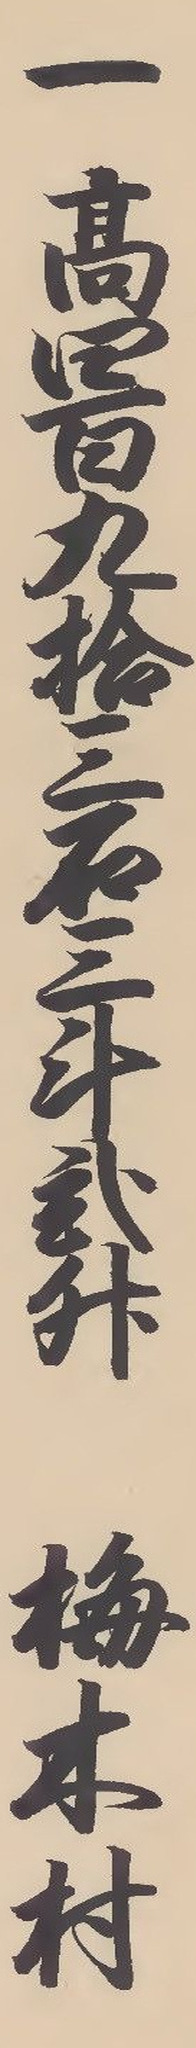一高四百九拾三石三斗弐升梅木村
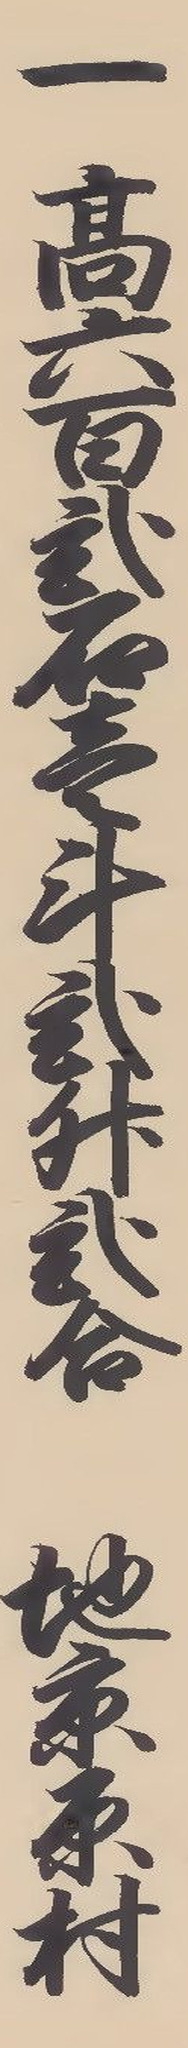一高六百弐石壱斗弐升弐合地京原村
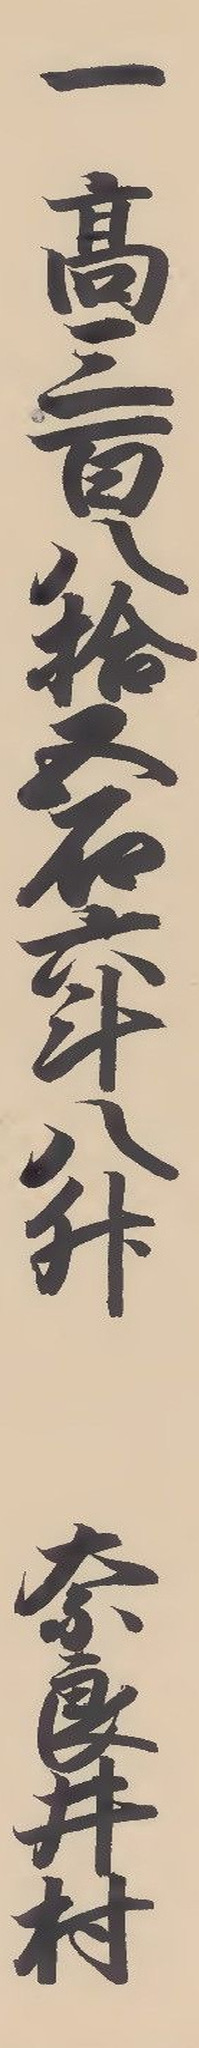一高三百八拾五石六斗八升奈良井村
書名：信濃国郷帳
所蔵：国立公文書館 National Archives of Japan
